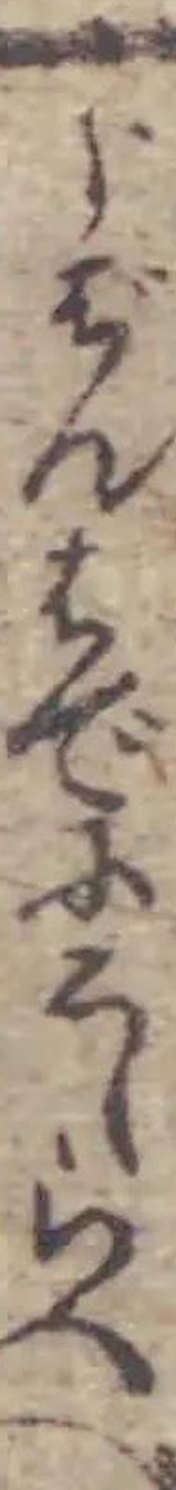じばんはでにこしらへ
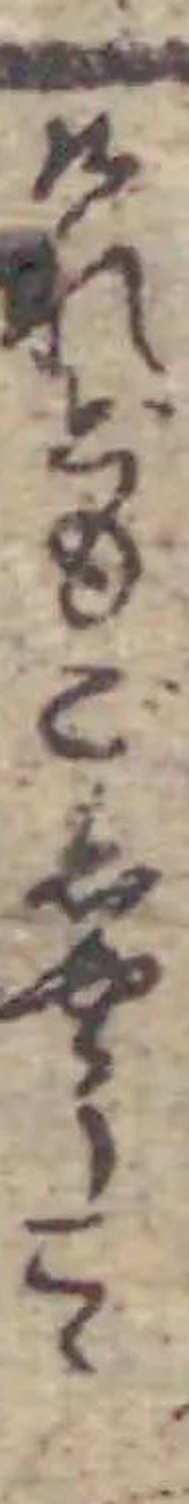けれどもごしやうこゝ
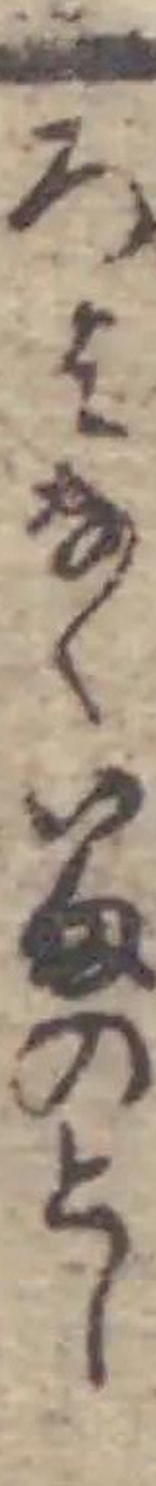ろはなくいまのとし
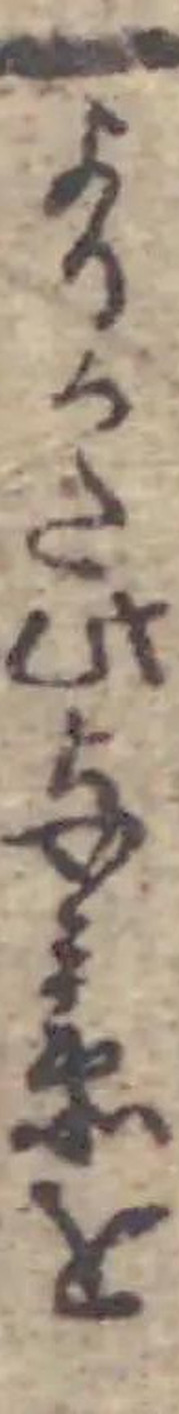よりかた此与兵衛を
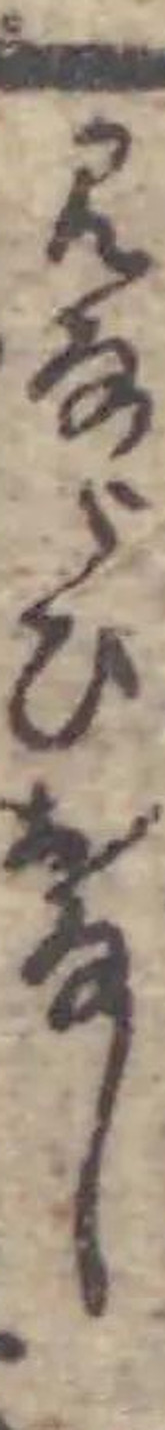見ならひおなし
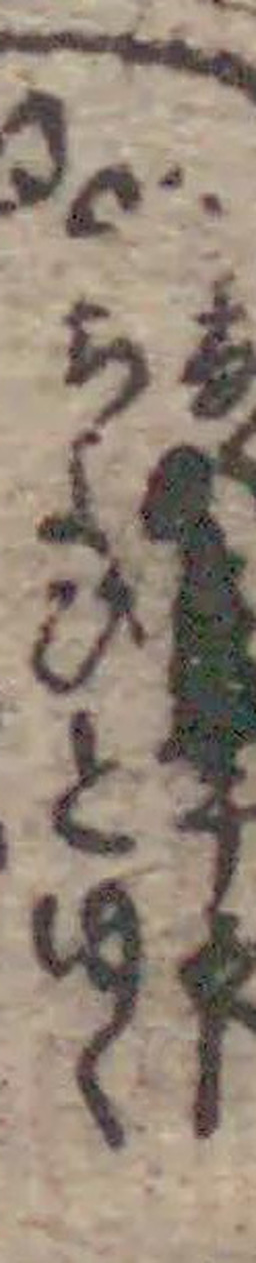ちよひとゆく
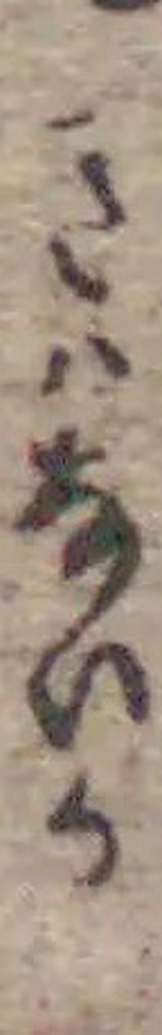きはないか
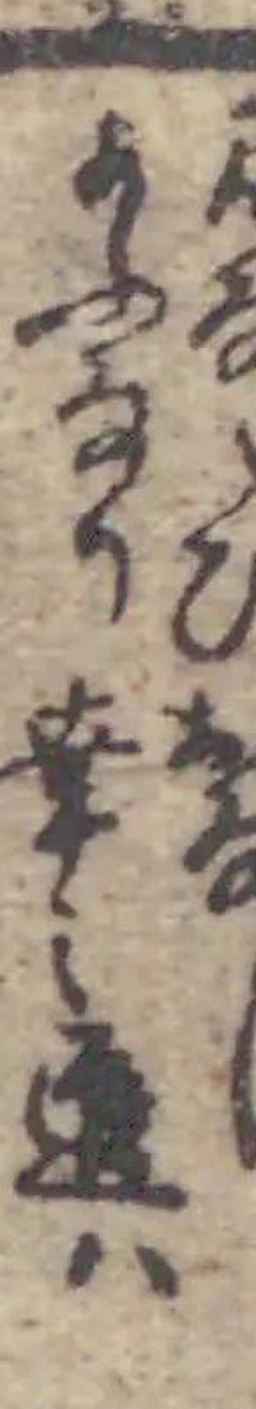あふなり幸之進は
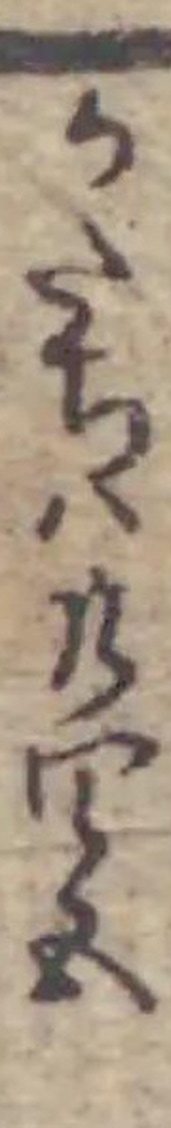かたちは廿四五
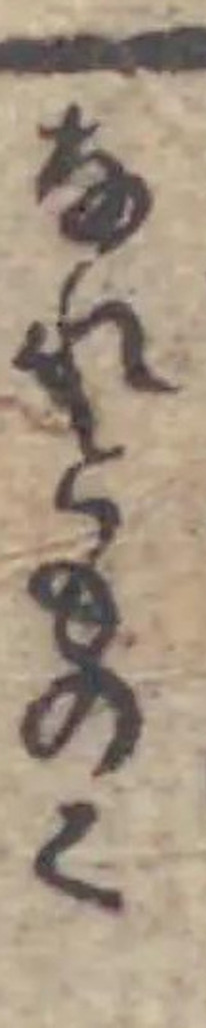なれとものこ
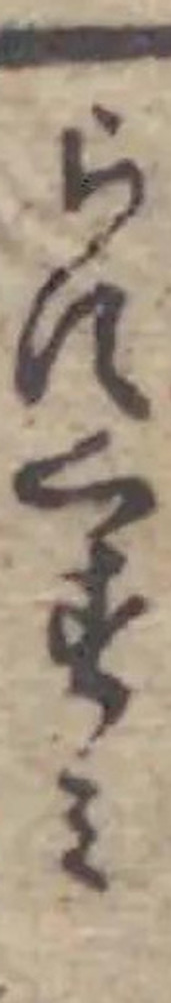らすくすみ
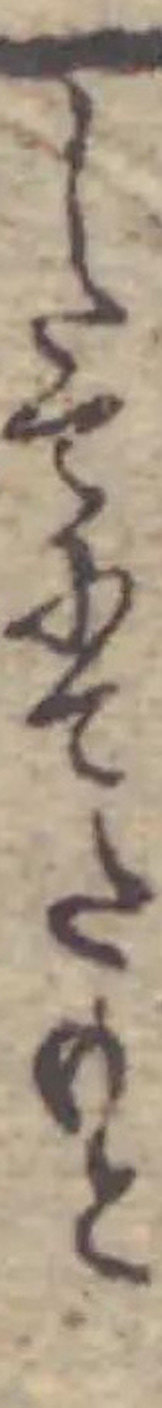したてにてたもと
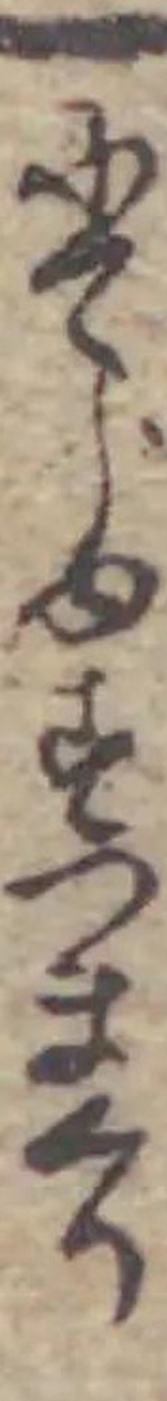にてじゆすつまくり
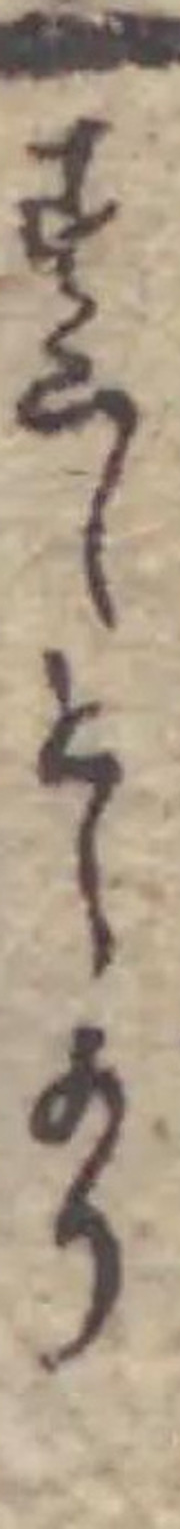すこしとしより
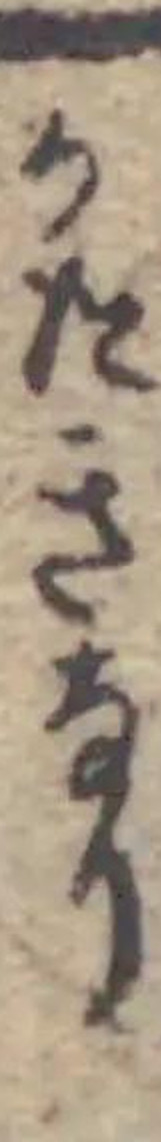かたきなり
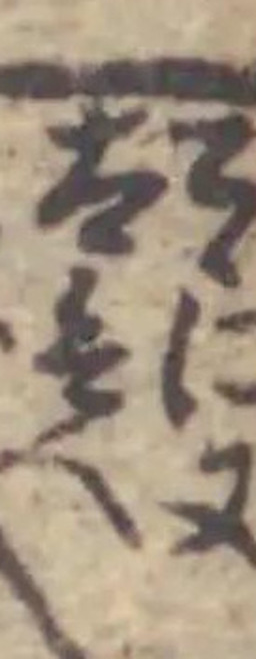太兵衛
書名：日待御利生此ごろ噂 3巻
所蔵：国立国会図書館 National Diet Library, JAPAN
